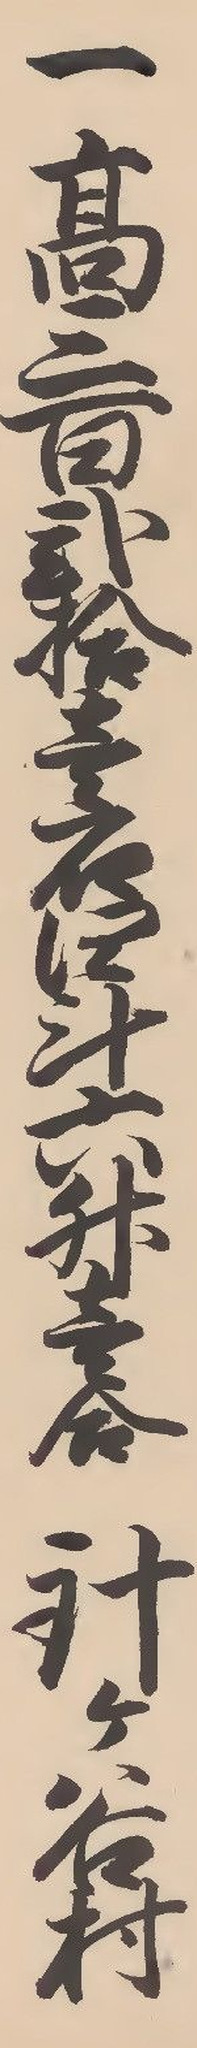一高三百弐拾壱石四斗六升壱合針ヶ谷村
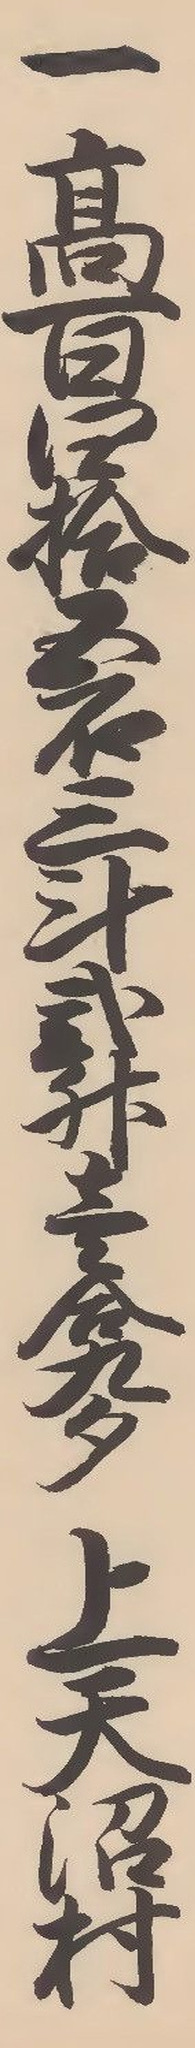一高百四拾五石三斗弐升壱合九勺上天沼村
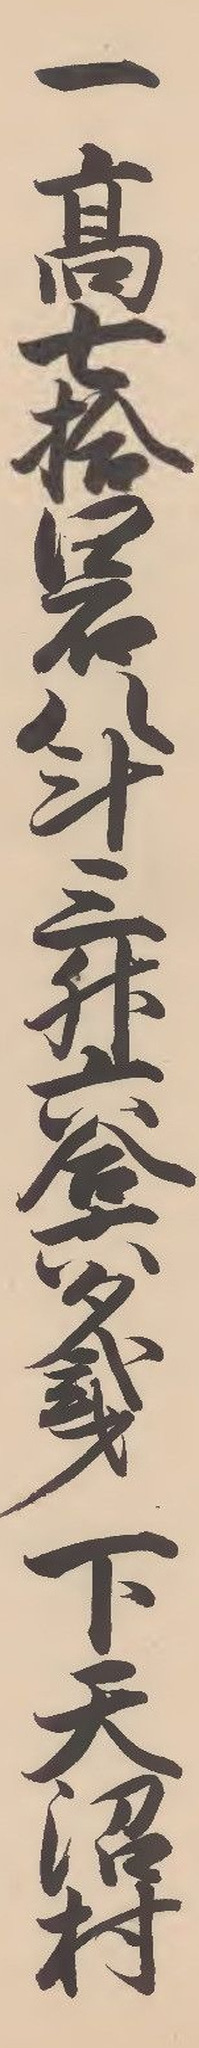一高七拾四石八斗三升六合六勺弐才下天沼村
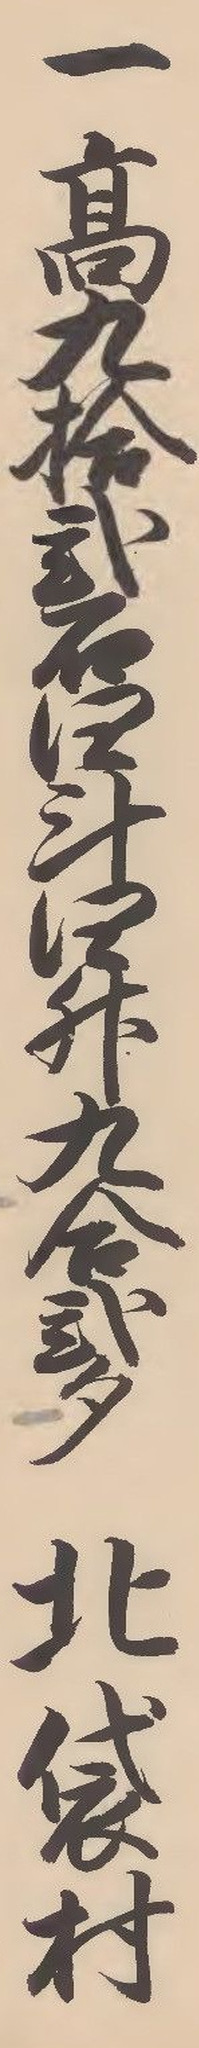一高九拾弐石四斗四升九合弐勺北袋村

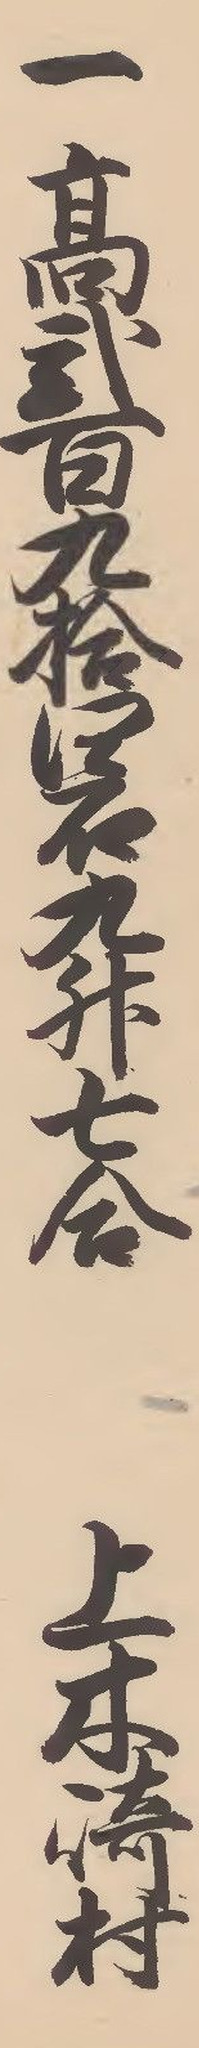一高弐百九拾四石九升七合上木崎村
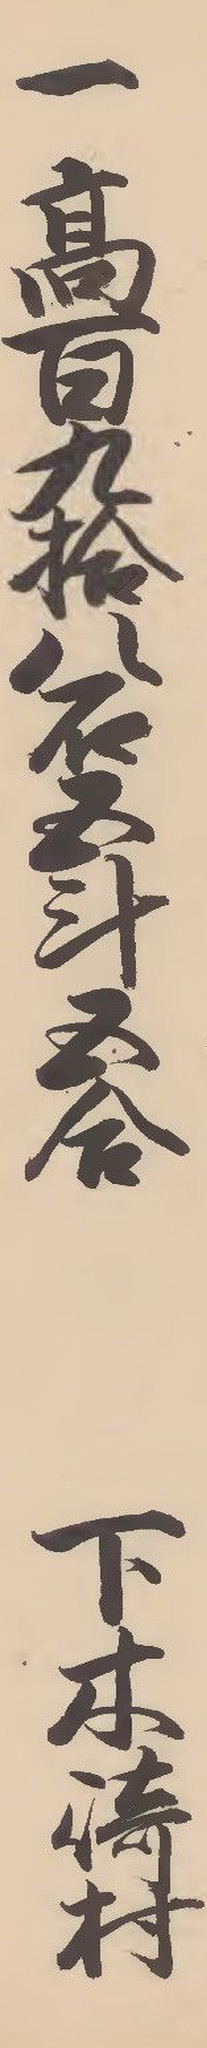一高百九拾八石五斗五合下木崎村
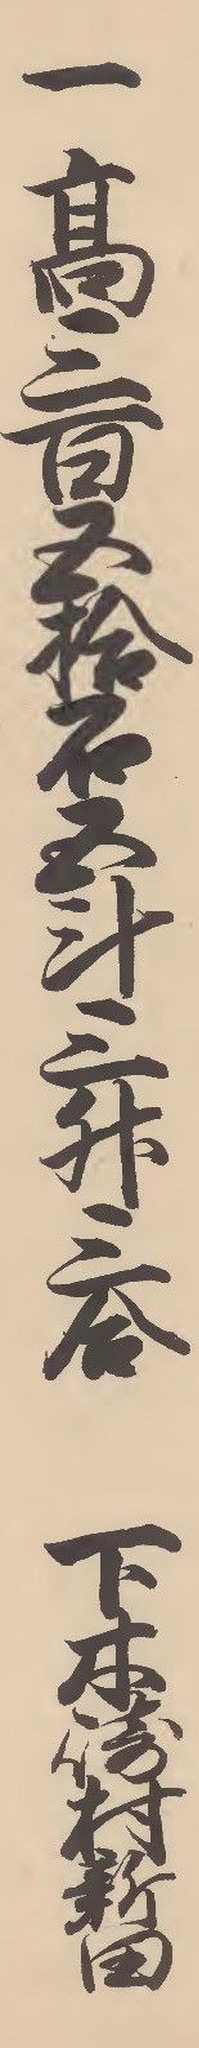一高三百五拾石五斗三升三合下木崎村新田
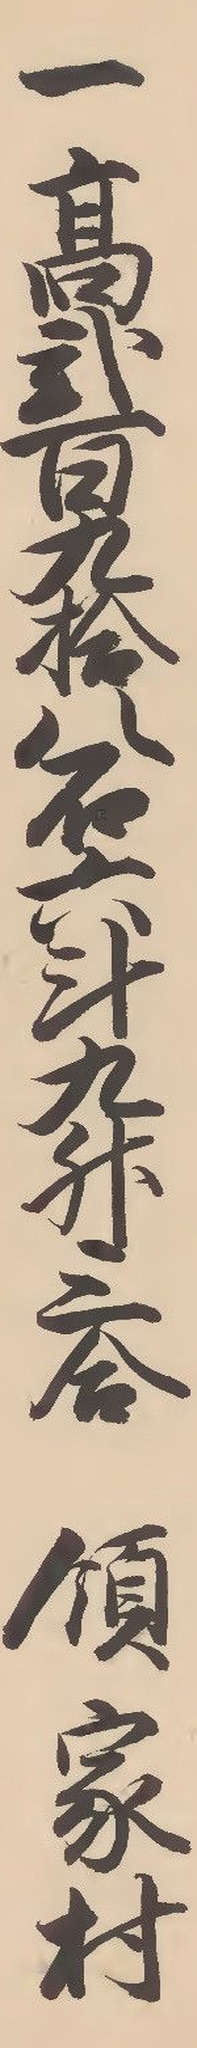一高弐百九拾八石六斗九升三合領家村
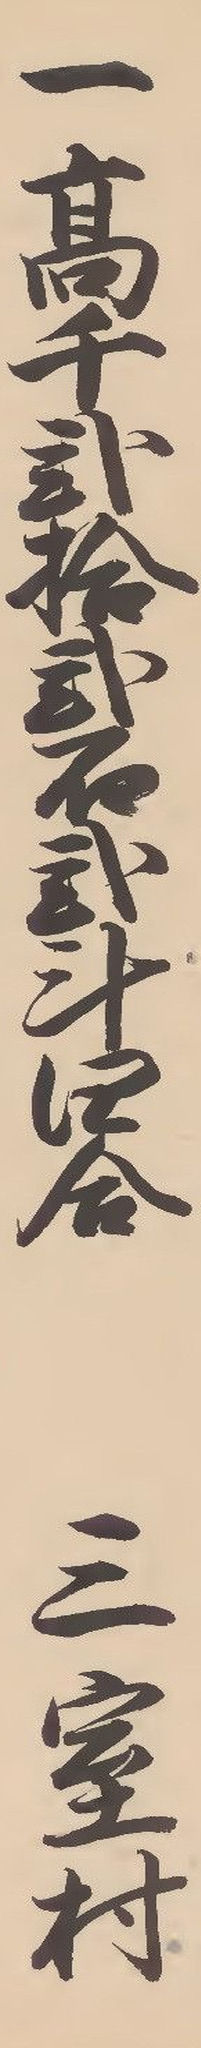一高千弐拾弐石弐斗四合三室村
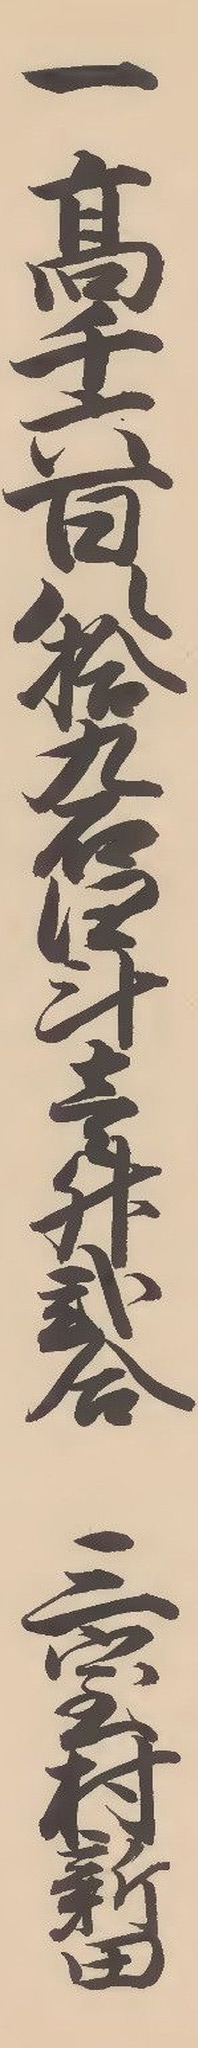一高千六百八拾九石四斗壱升弐合三室村新田
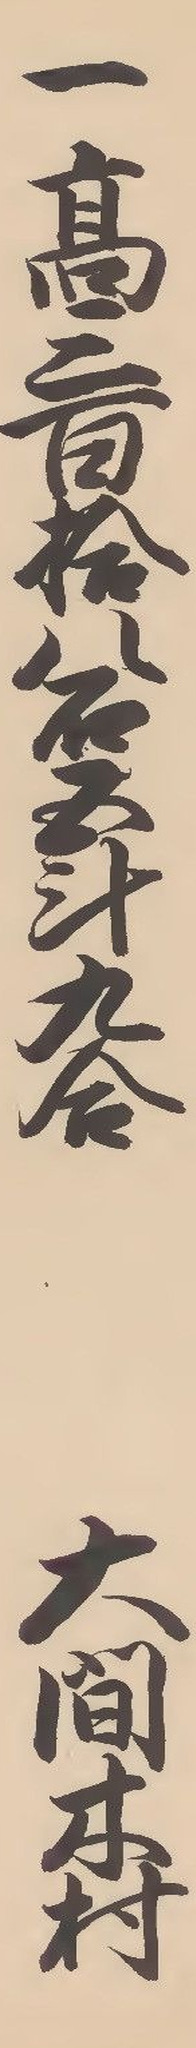一高三百拾八石五斗九合大間木村
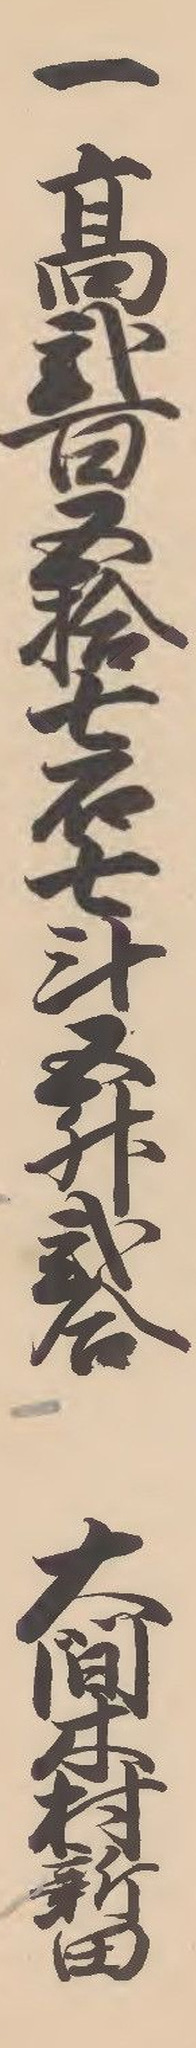一高弐百五拾七石七斗五升弐合大間木村新田

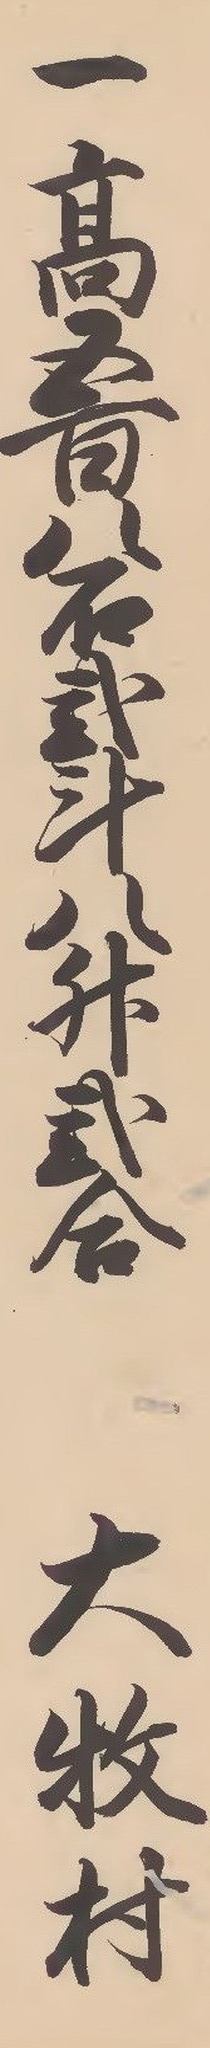一高五百八石弐斗八升弐合大牧村
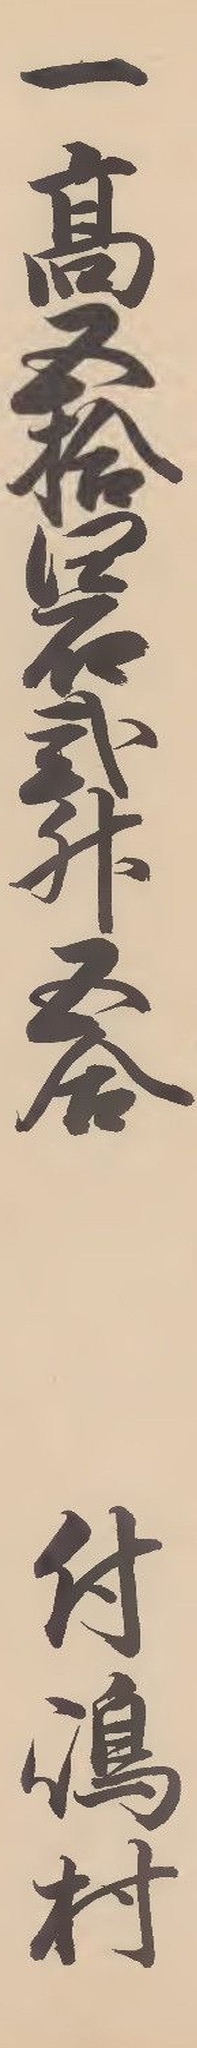一高五拾四石弐升五合付嶋村
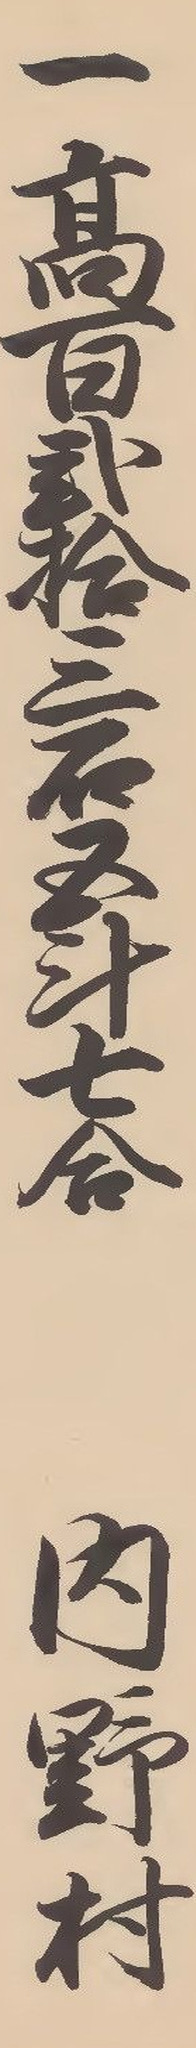一高百弐拾三石五斗七合内野村
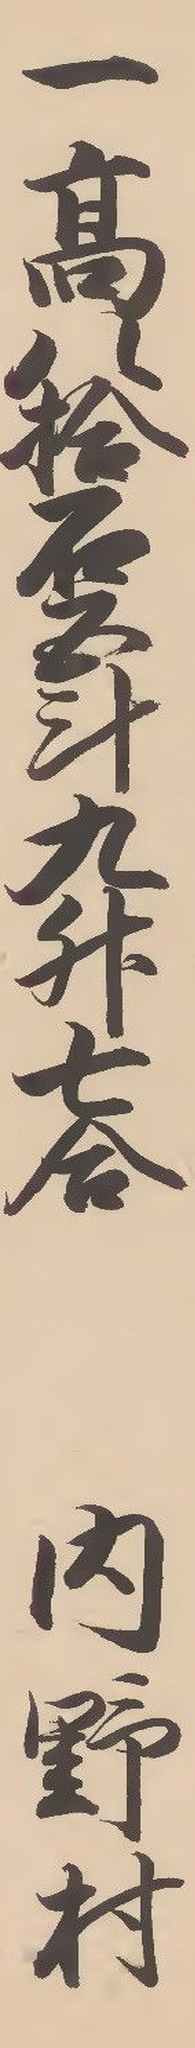一高八拾石五斗九升七合内野村
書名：武蔵国郷帳　下
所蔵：国立公文書館 National Archives of Japan
